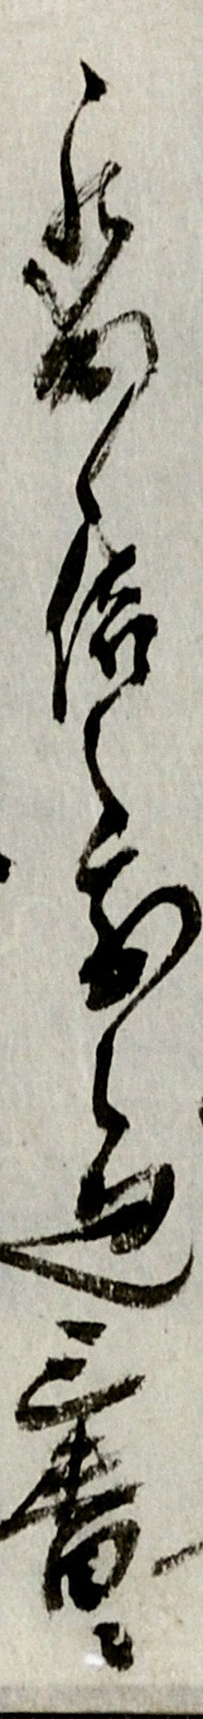罷出候依之前之通三番ニ
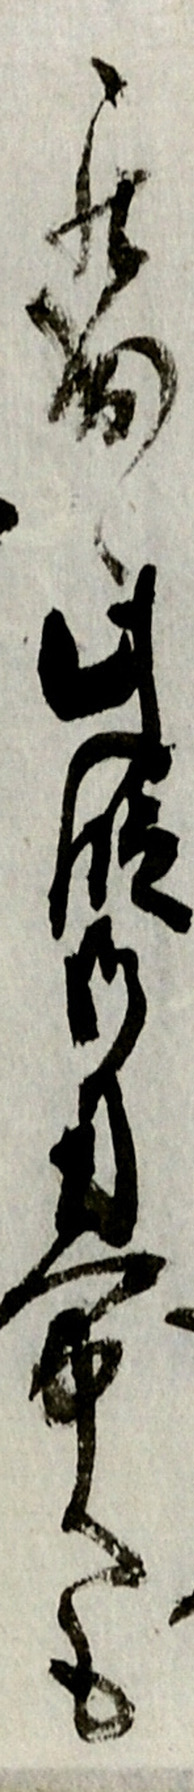罷出候此段御用人中へも
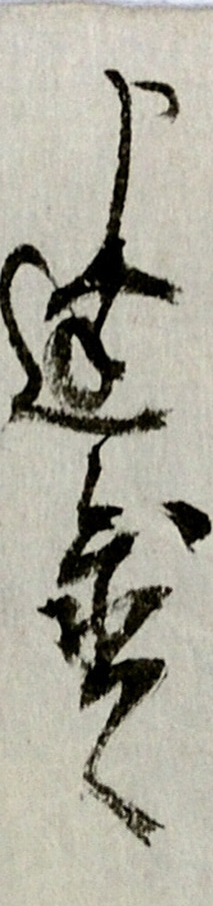申達置候
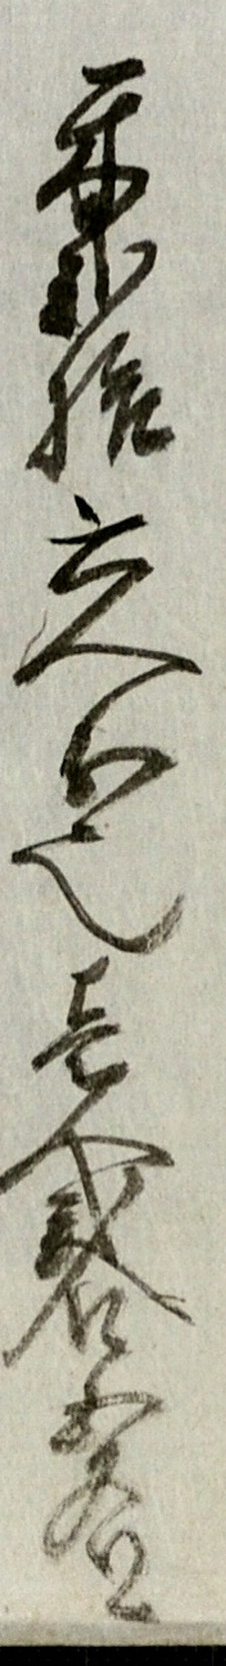米弐拾六人分也壱人弐合五勺つゝ
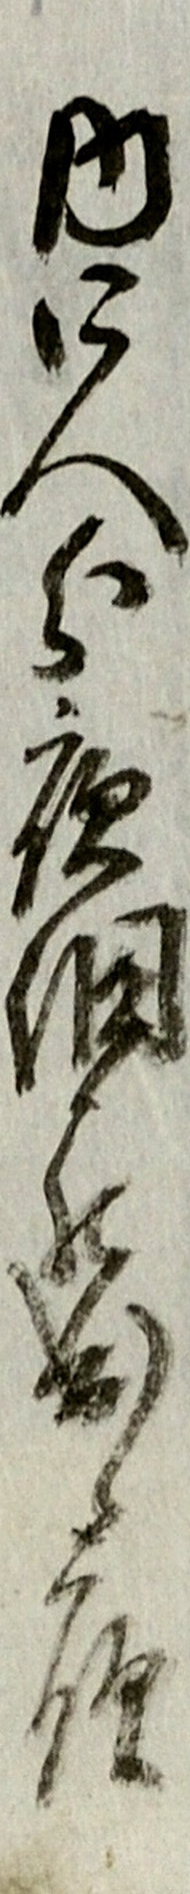内四人分夜網罷出候夜
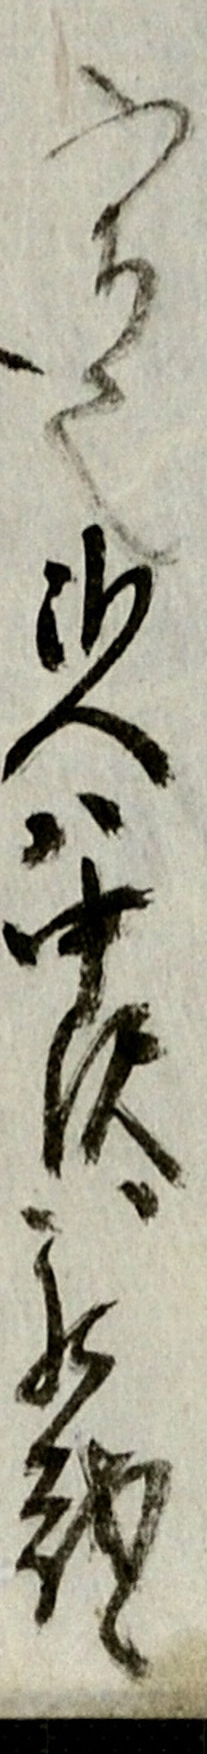ふち也弐人は中沢へ罷越候
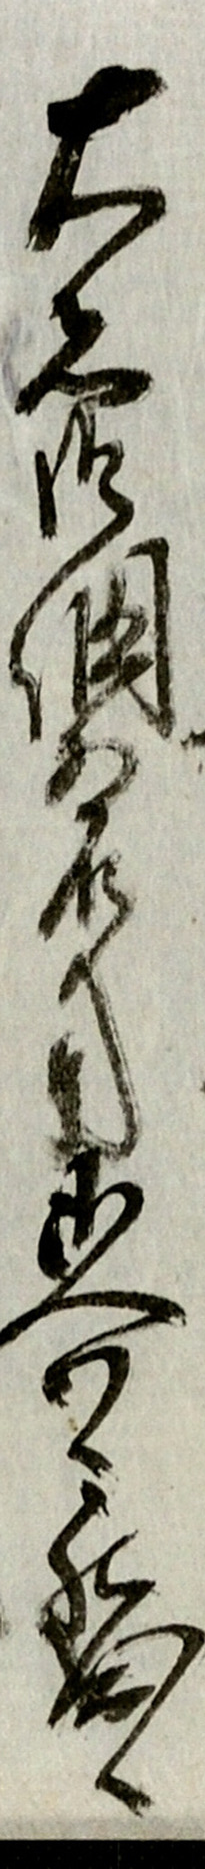右は御網為御用弐人つゝ罷出候
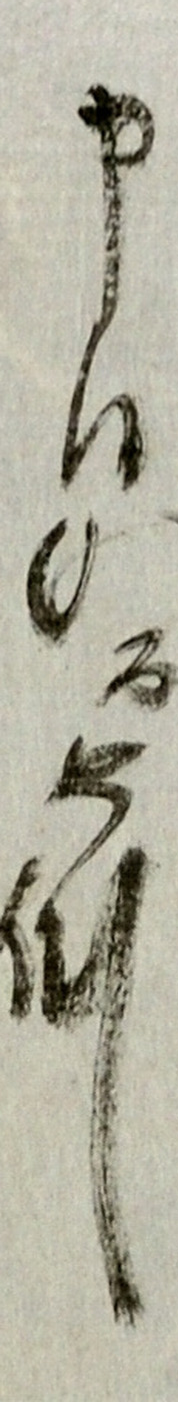申候仍而如件
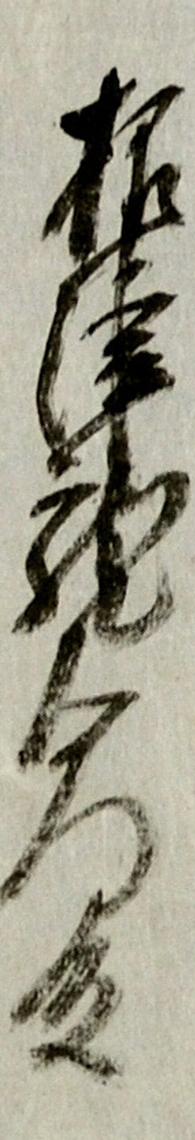根津龍右衛門殿
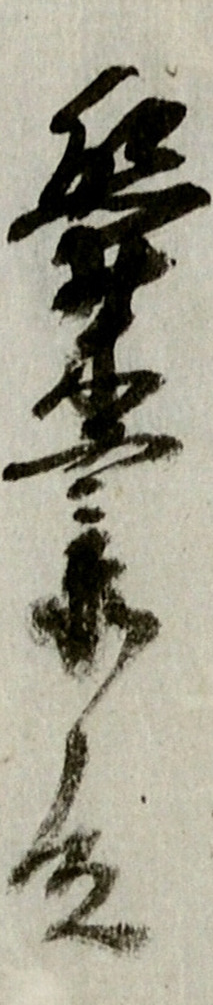熊井杢兵衛殿
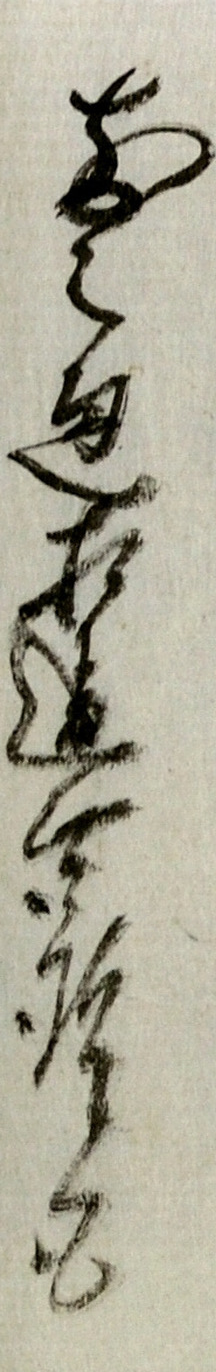前之通相違無御座候以上

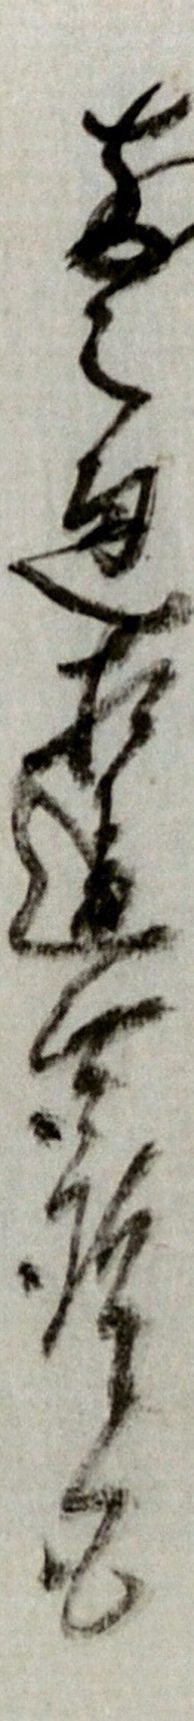前書之通相違無御座候以上
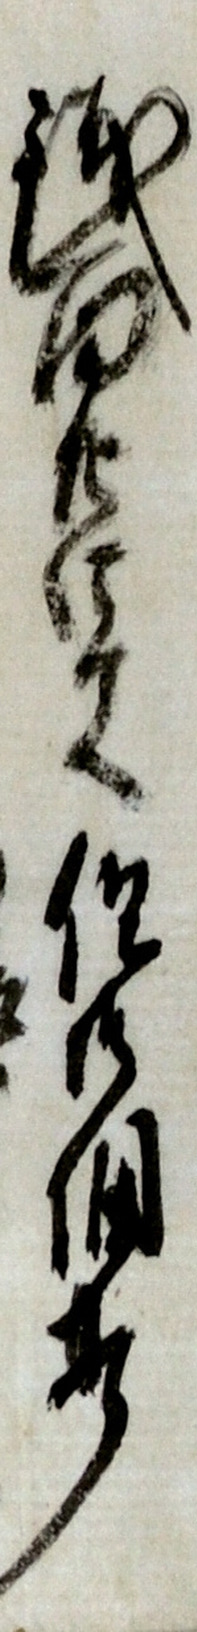銭百廿四文但御網打
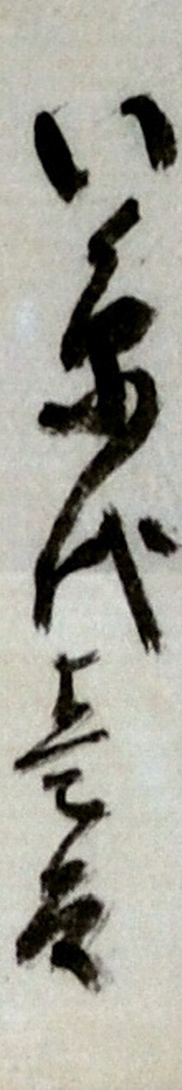い糸代壱反
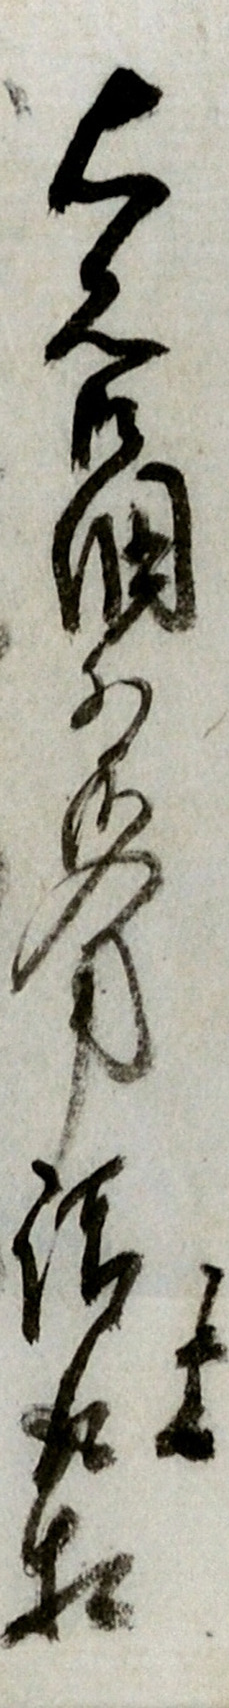右は御網打御入用請取相
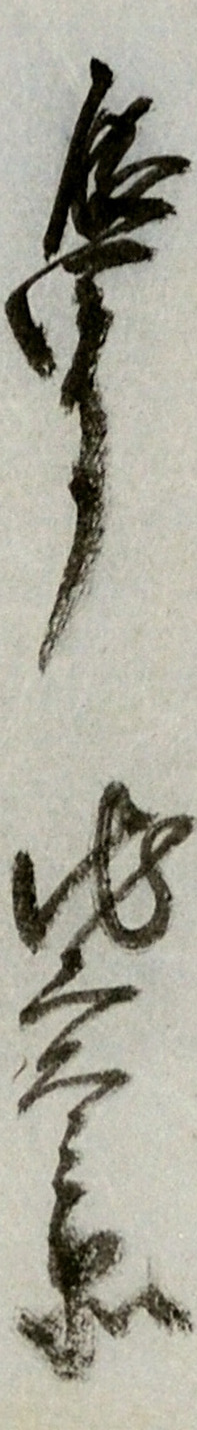辰四月池上久兵衛
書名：分一方諸事御用留帳
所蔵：伊那市立高遠町図書館・合同会社AMANE
